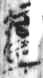○（復）
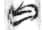於
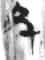丑
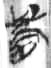○（怨）
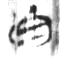於
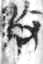○（媚）
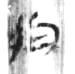於
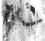卯
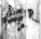凡
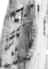○（建）
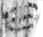日
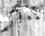大
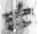吉
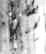利（利）
